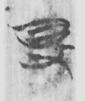𠭁
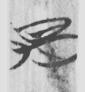是
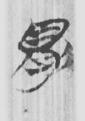{胃刀}
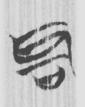{㠯ㅋ}
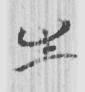生
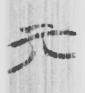亓
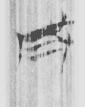{戊二}
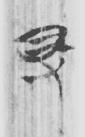𠭁
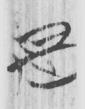是
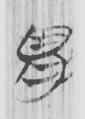{胃刀}
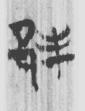邦
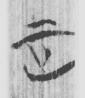正
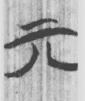亓
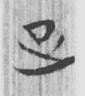疋
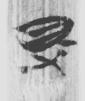𠭁
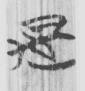是
